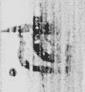必
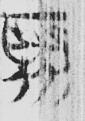聚
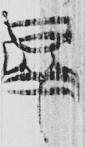羣
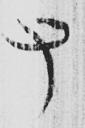又（有）
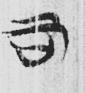司
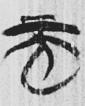而
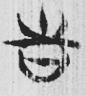告
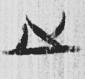之
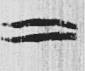二
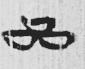○（參）
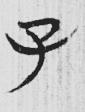子
